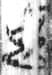妻
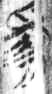○（嫁）
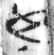女
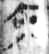內（入）
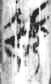貨
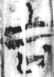吉
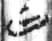㠯（以）
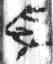見
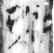邦
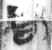君
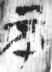不
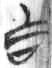吉
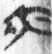亦
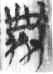無
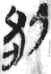咎
